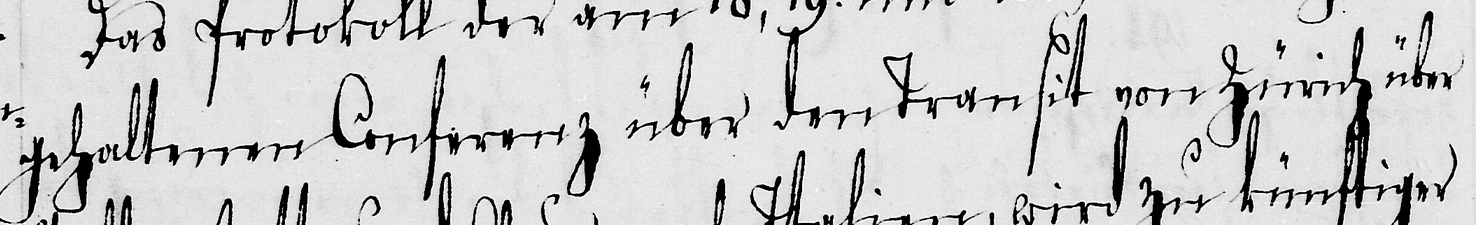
gehaltenen Conferenz über den Transit von Zürich über
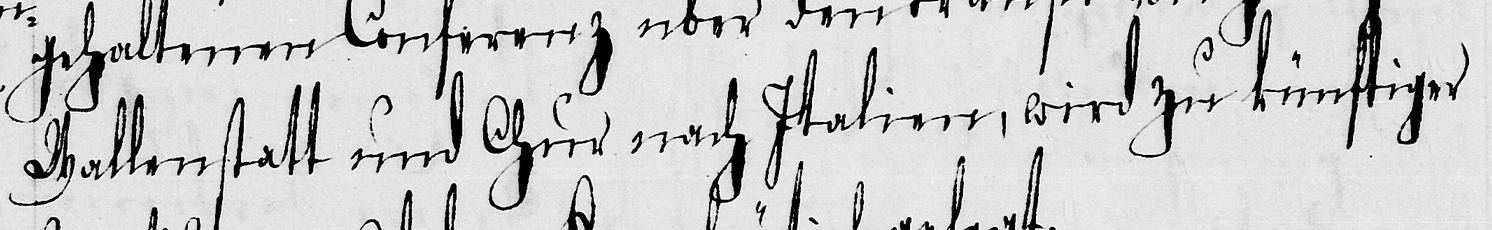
Wallenstatt und Chur nach Italien, wird zu künftiger
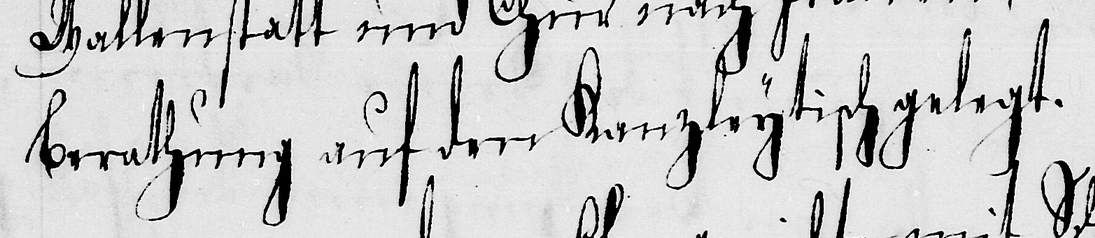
Berathung auf den Kanzleytisch gelegt.
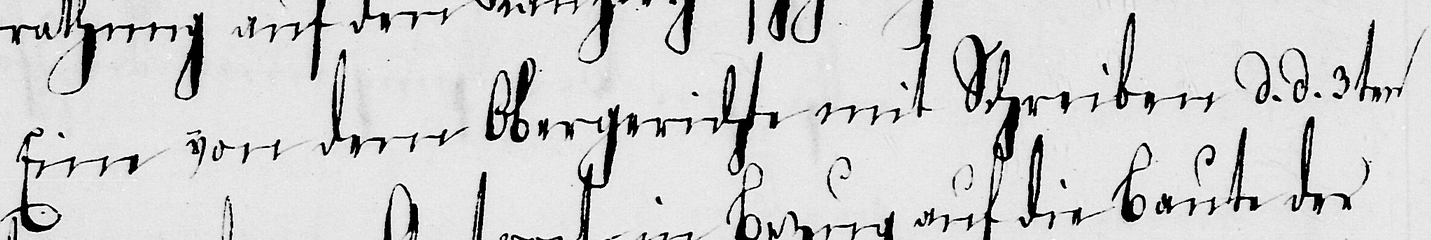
Eine von dem Obergerichte mit Schreiben d. d. 3ten
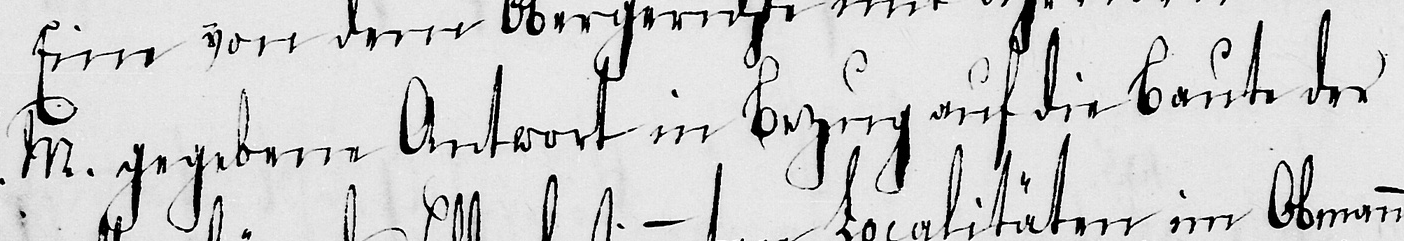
M. gegebenen Antwort in Bezug auf die Baute der
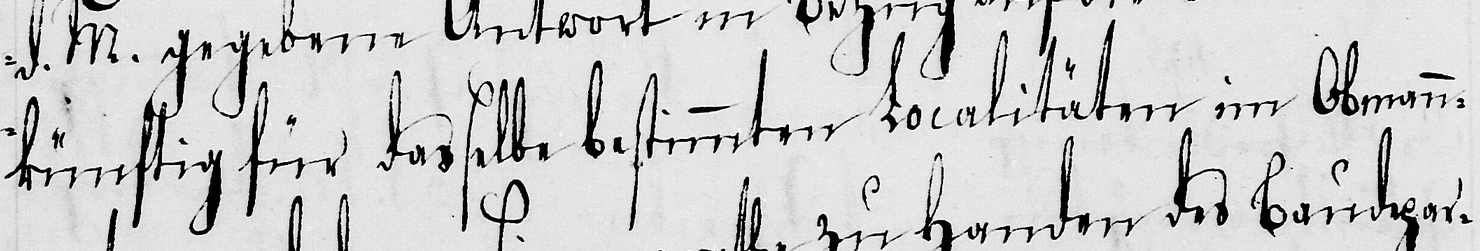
künftig für dasselbe bestimmten Localitäten im Obmann¬
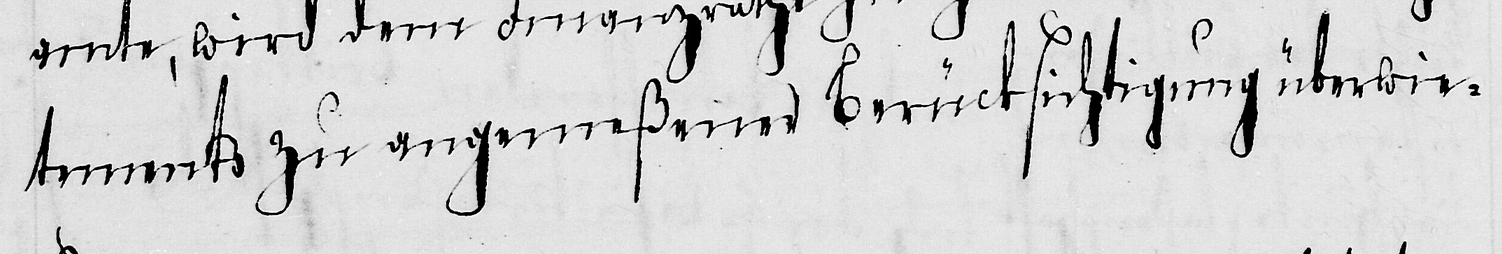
tements zu angemeßener Berücksichtigung überwie¬
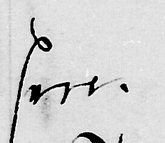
sen.
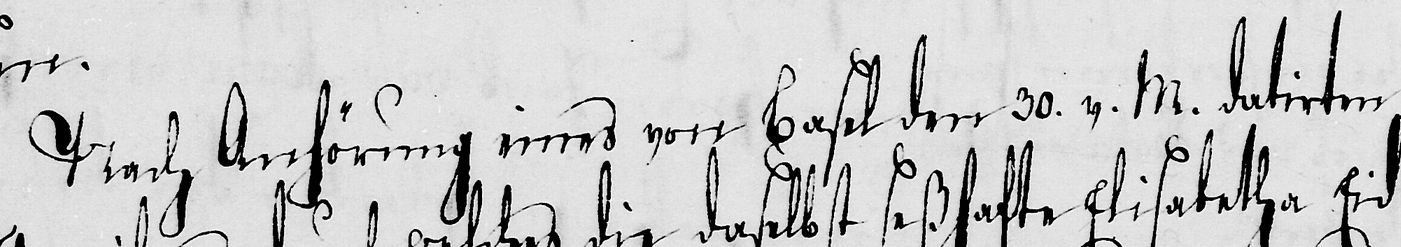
Nach Anhörung eines von Basel den 30. v. M. datirten
